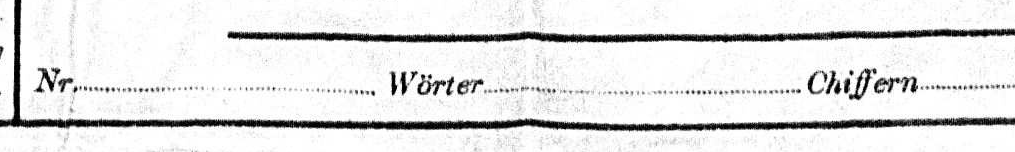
Nr.................................Wörter...............................Chiffern.................
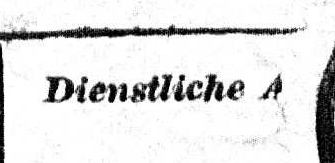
xx
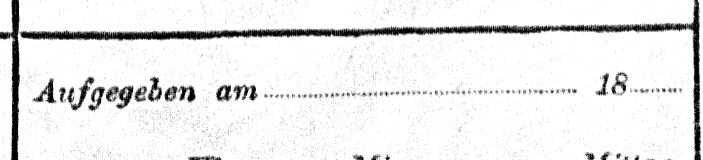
Aufgegeben am................................18....
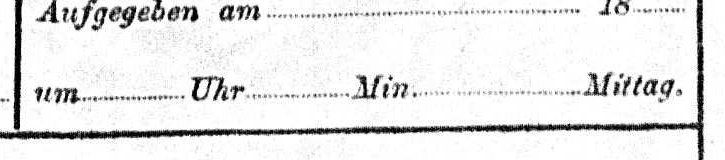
um ...............Uhr..........Min..............Mittag.
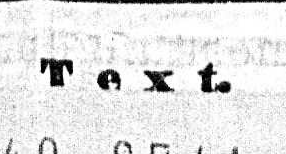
Text.
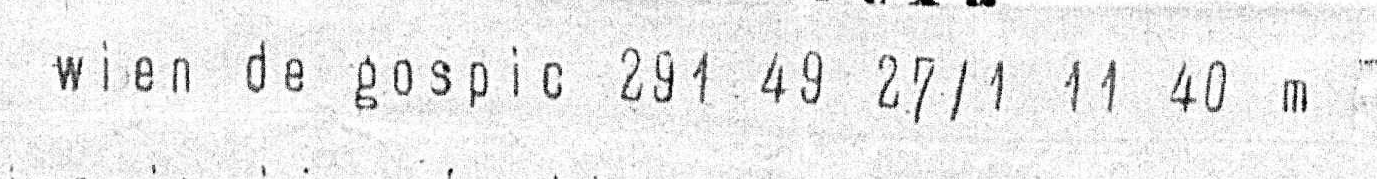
wien de gospic 291 49 27/1 11 40 m
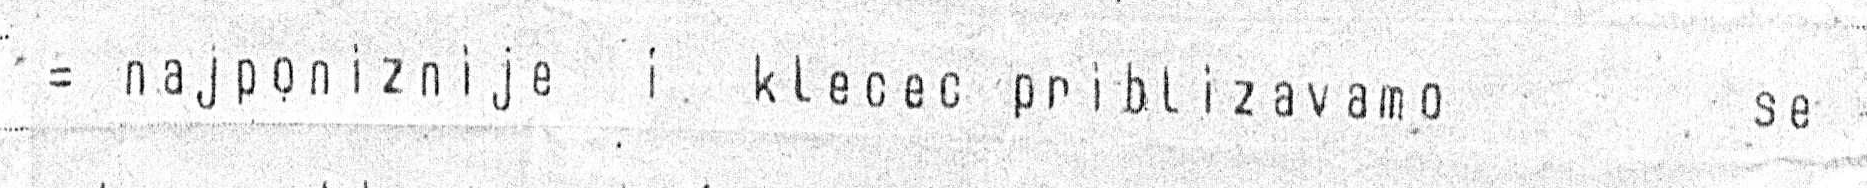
= najponiznije i klecec priblizavamo se
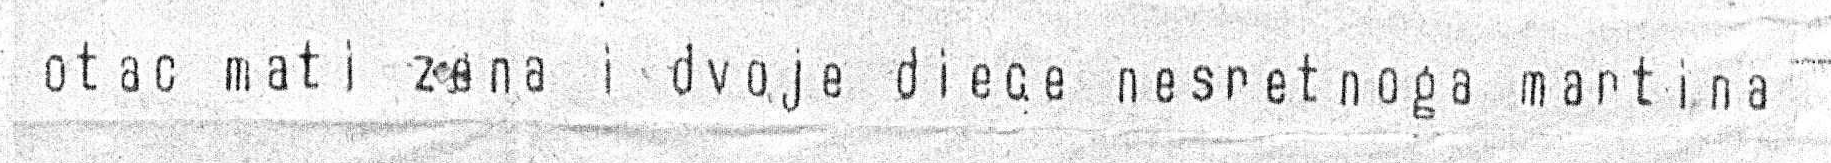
otac mati zona i dvoje diece nesretnoga martina
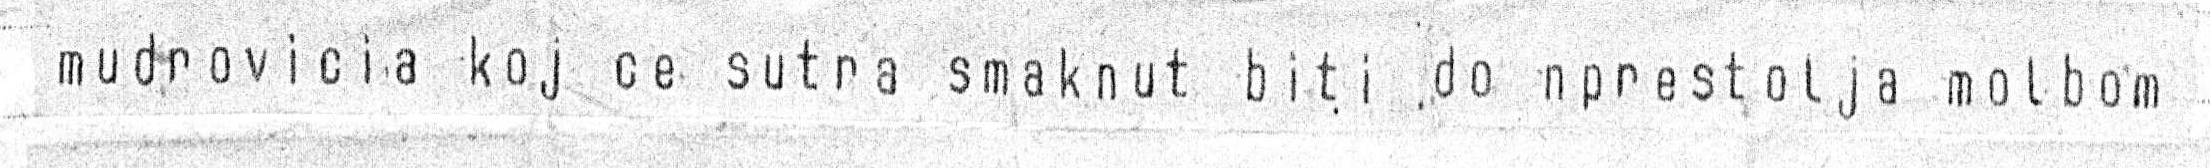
mudrovicia koj ce sutra smaknut biti do nprestolja molbom
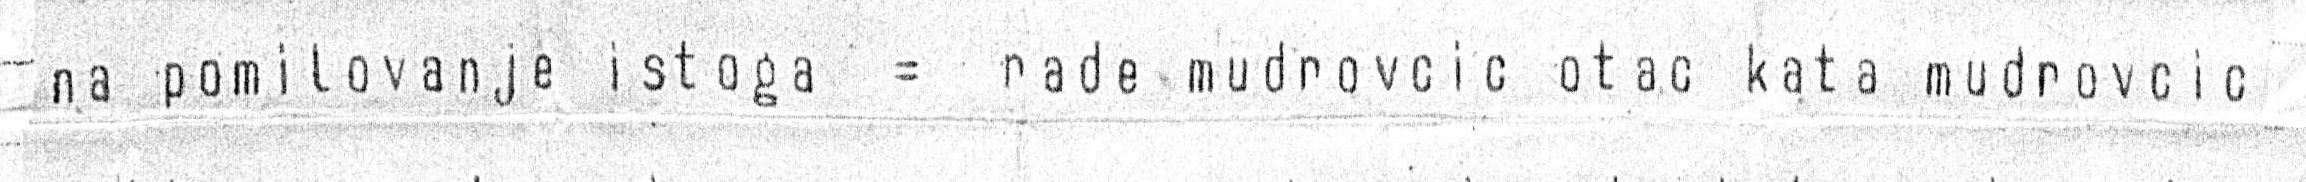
na pomilovanje istoga = rade mudrovcic otac kata mudrovcic
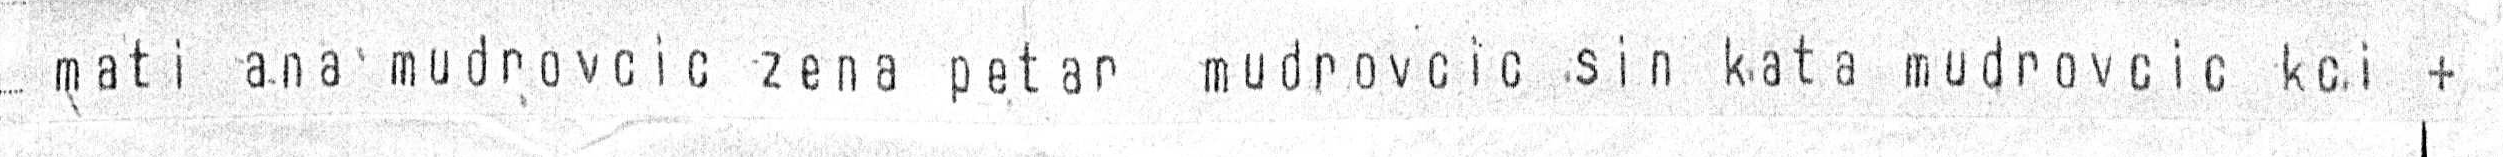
mati ana mudrovcic zena petar mudrovcic sin kata mudrovcic kci +
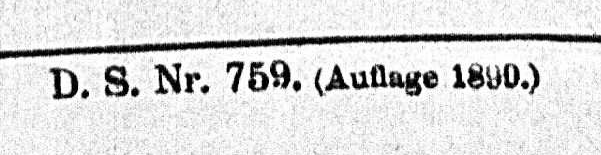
D. S. Nr. 759. (Auflage 1890.)
